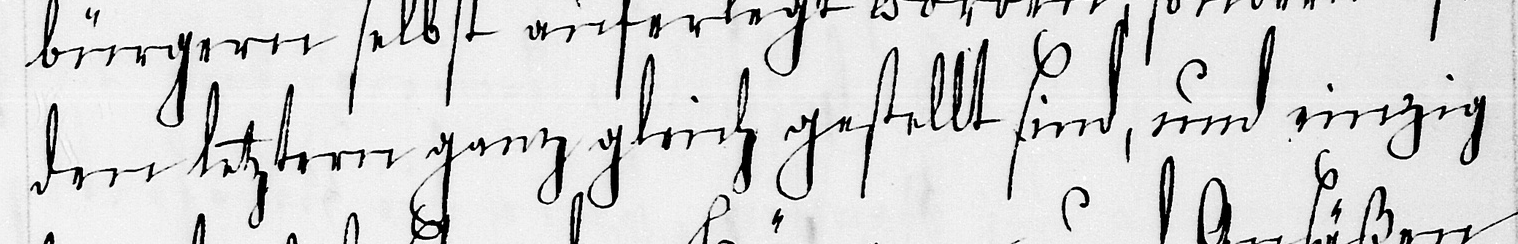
den letztern ganz gleich gestellt sind, und einzig
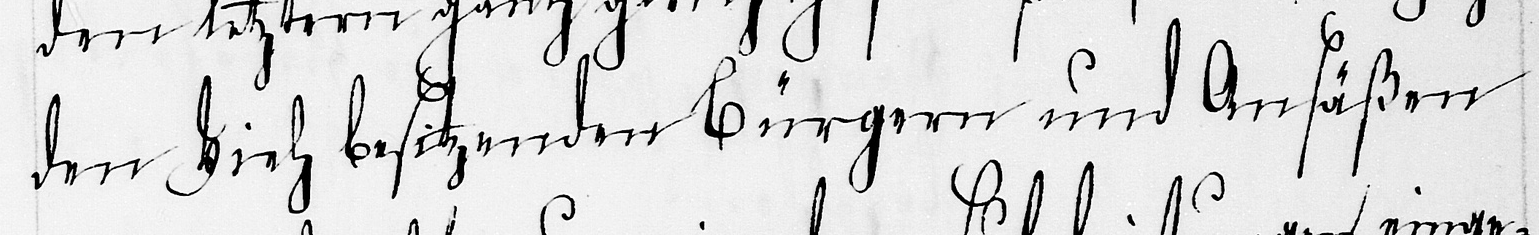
den Vieh besitzenden Bürgern und Ansäßen
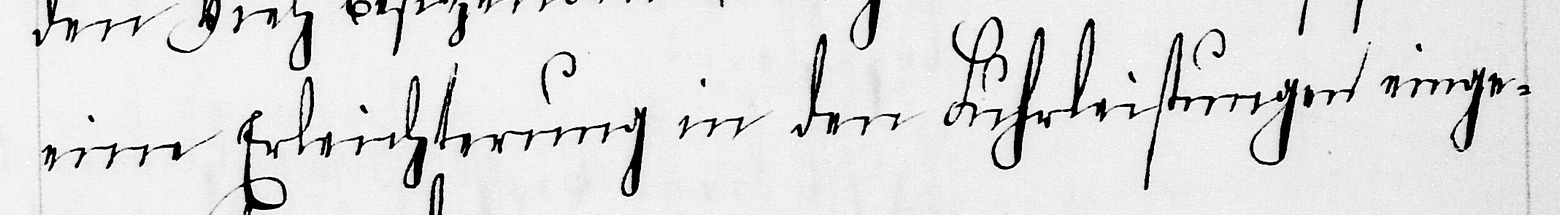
eine Erleichterung in den Fuhrleistungen einge¬
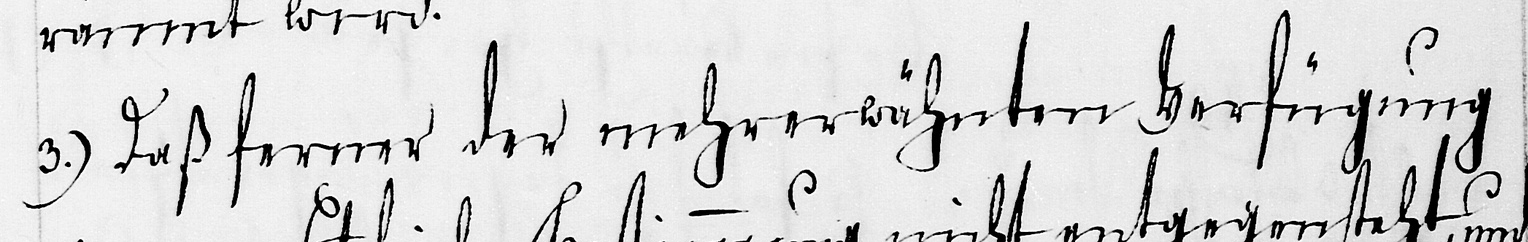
3.) Daß ferner der mehrerwähnten Verfügung
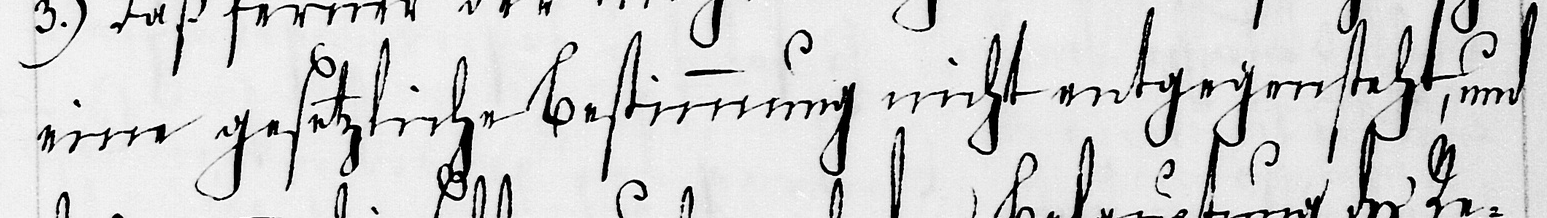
eine gesetzliche Bestimmung nicht entgegensteht, und
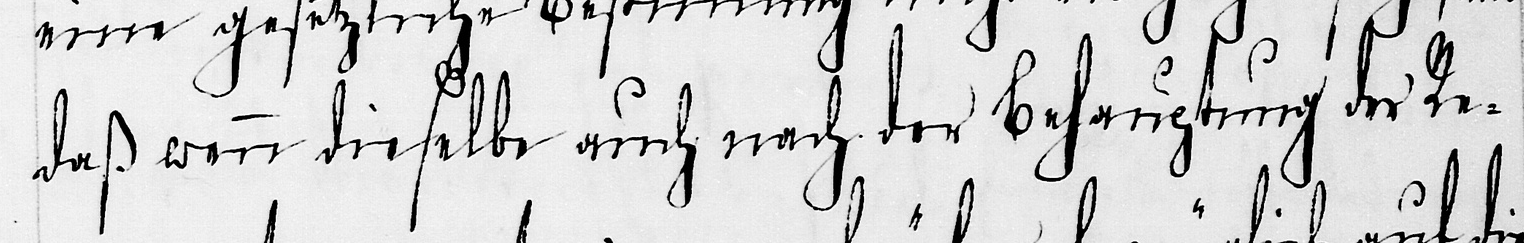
daß wenn dieselbe auch nach der Behauptung der Re¬
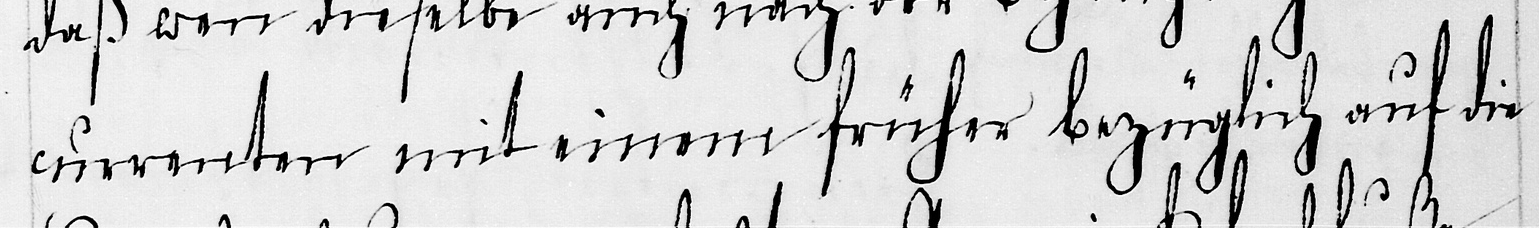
currenten mit einem früher bezüglich auf die
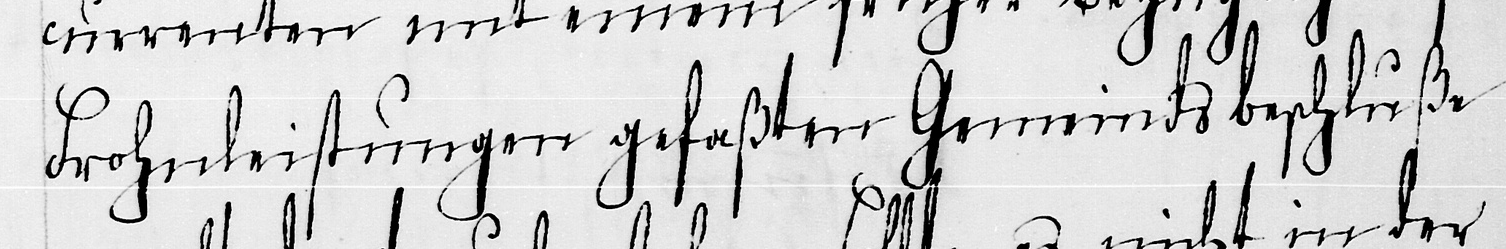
Frohnleistungen gefaßten Gemeindsbeschluße
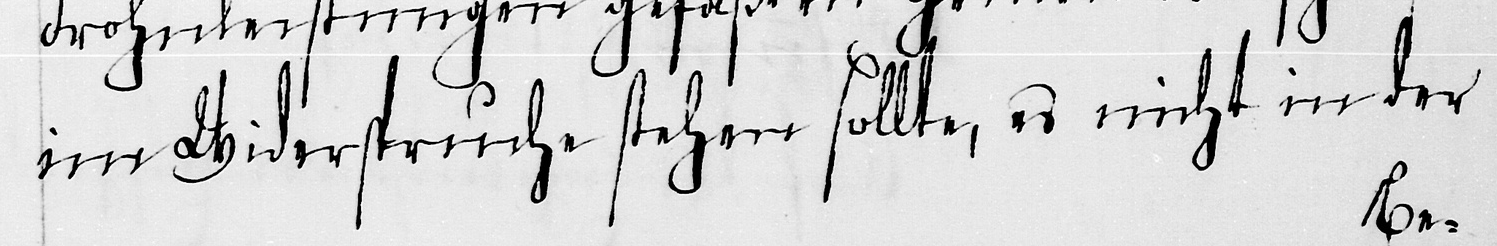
im Widerspruche stehen sollte, es nicht in der
